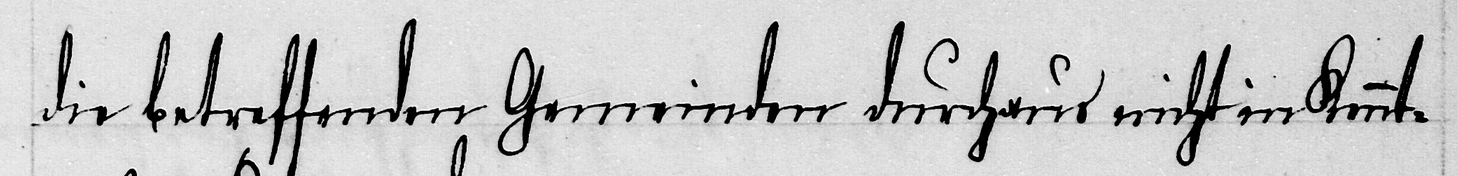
die betreffenden Gemeinden durchaus nicht in Ken¬
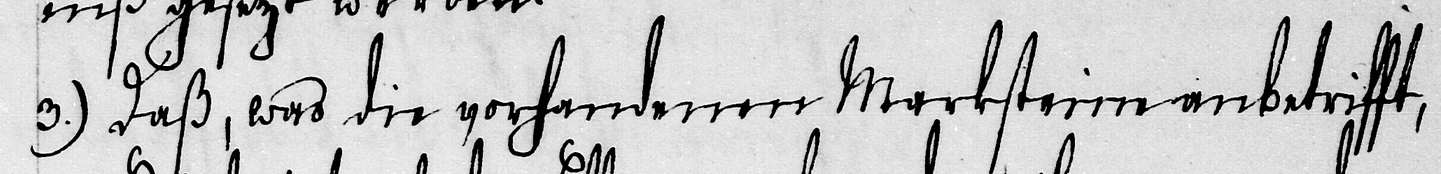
3.) Daß, was die vorhandenen Marksteine anbetriff¬
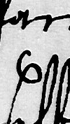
d.
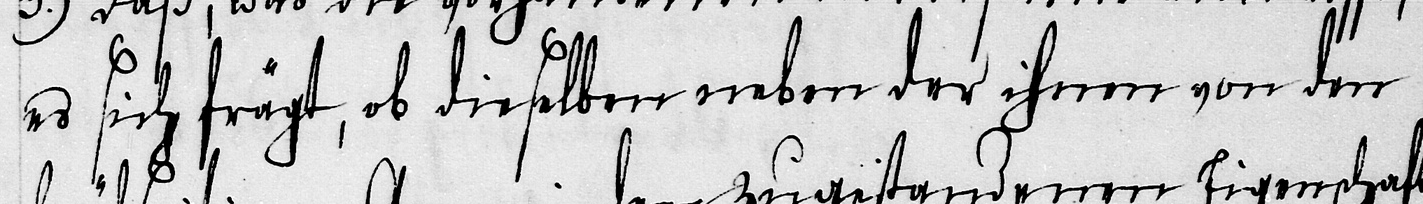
es sich frägt, ob dieselben neben der ihnen von den
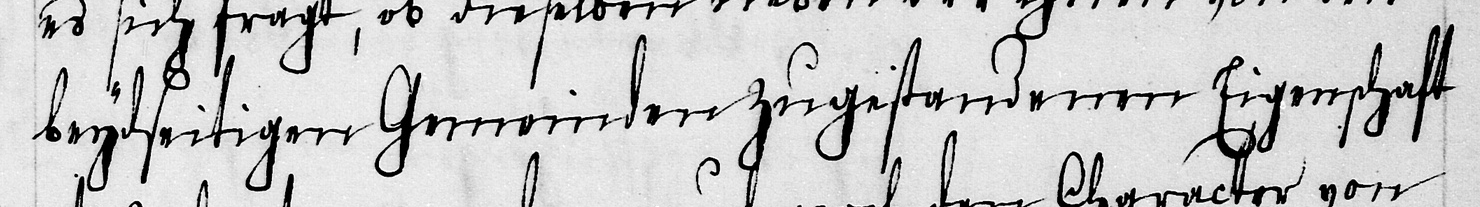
beydseitigen Gemeinden zugestandenen Eigenschaft
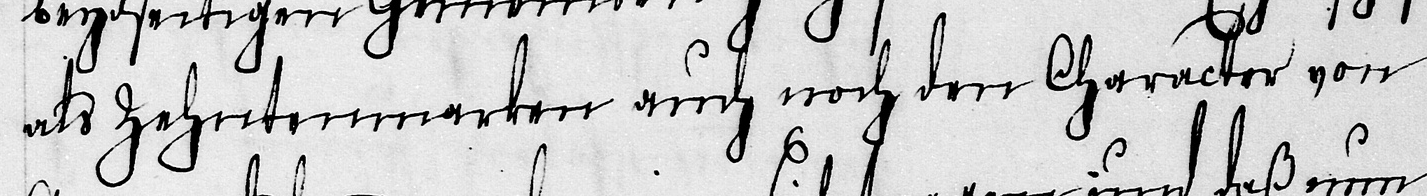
als Zehntenmarken auch noch den Character von
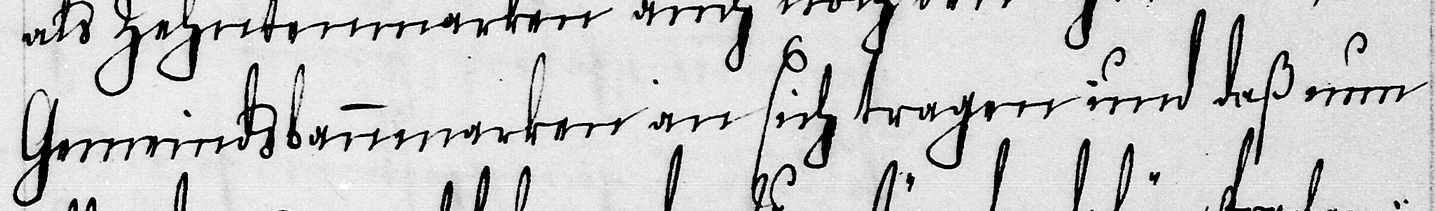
Gemeindsbannmarken an sich tragen und daß nun
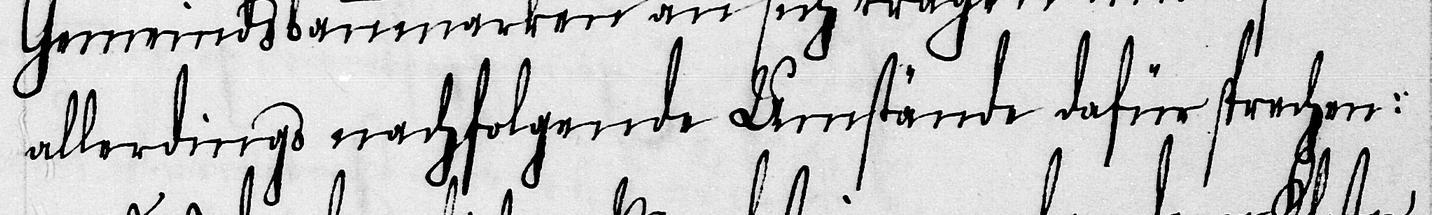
allerdings nachfolgende Umstände dafür sprechen:
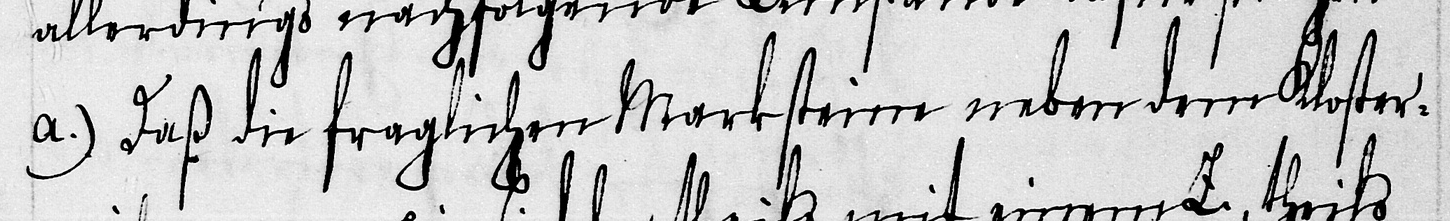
a.) Daß die fraglichen Marksteine neben dem Kloster¬
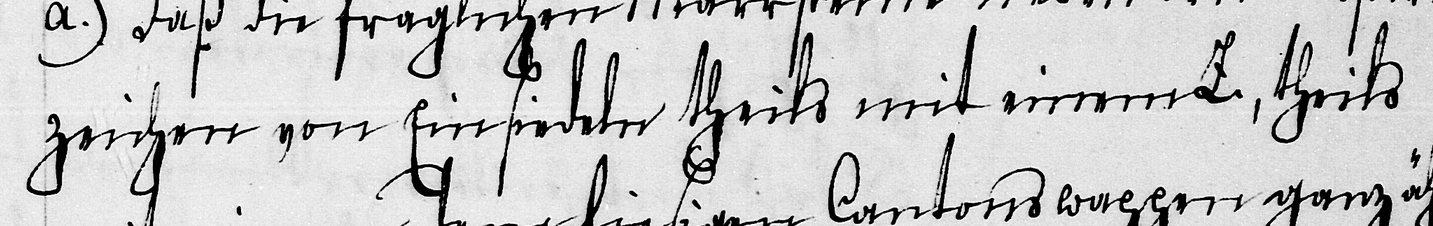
zeichen von Einsiedeln theils mit einem Z, theils
